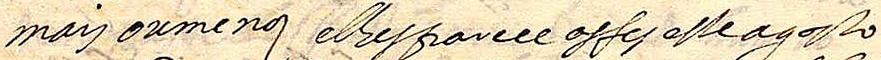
maio ou menos e lhes parece as fes este agosto
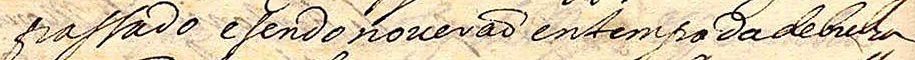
passado e sendo no uerão en tempo da debulha
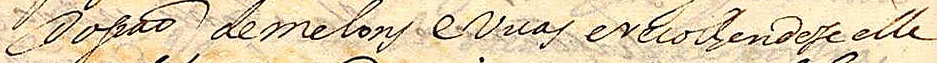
do pão de melons e vuas e recolhendose elle
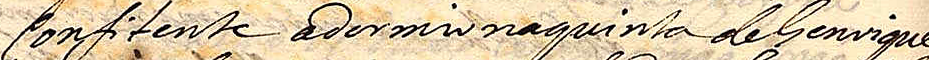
Confitente a dormir na quinta de henrique
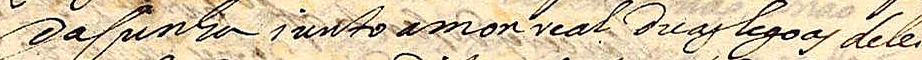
da Cunha iunto a mon real duas legoas de lei
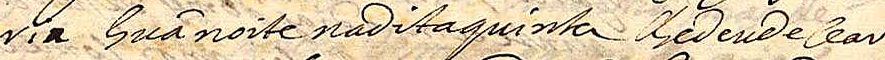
ria huā noite na dita quinta lhe deu de Cear
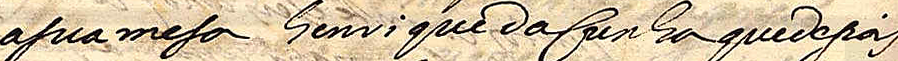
a sua mesa henrique da Cunha que depois
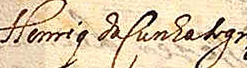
Henriq da Cunha sogro
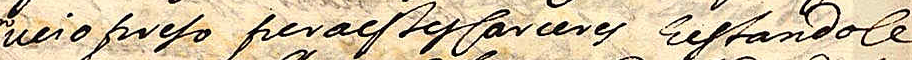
ueio preso pera estes Carceres E estando Ce
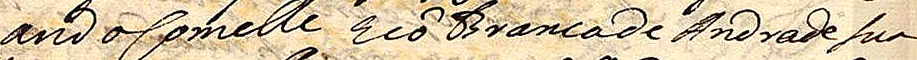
ando Com elle E cō Branca de Andrade sua
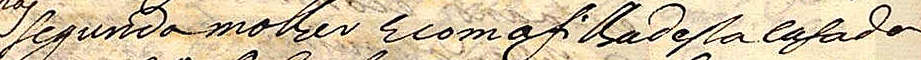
segunda molher E com a filha desta casada
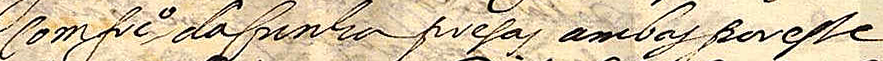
Com frco da Cunha presas ambas por este
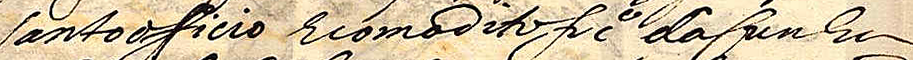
santo officio E com o dito frco da Cunha
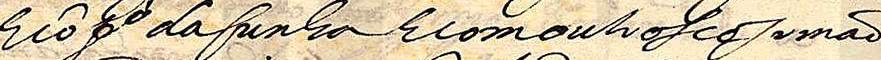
E cō po da Cunha E com outro seo jrmão
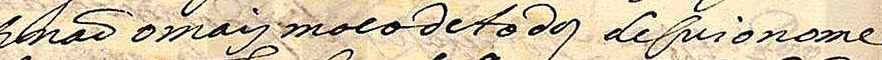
E não o mais moco de todos de Cuio nome
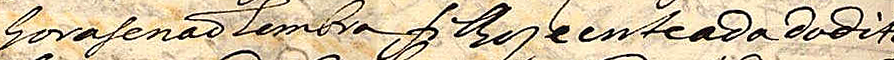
hora se não Lembra filhos e enteada do dito
